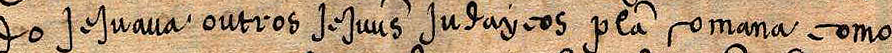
do JeJuaua outros JeJuūs Judaycos plā somana como
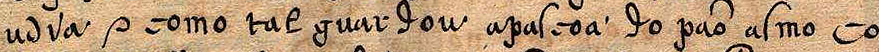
Judia e como tal guardou a pascoa do paõ asmo co
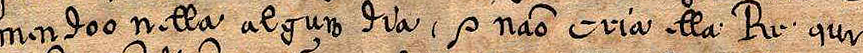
mendoo nella algum dia / e naõ cria ella Re que
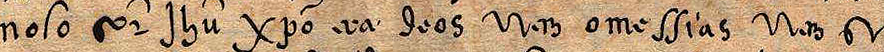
noso sor̄ Jhū Xpō era deos Nem o messias Nem se
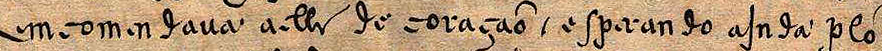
emcomendaua a elle de coraçaõ / esperando aJnda plō
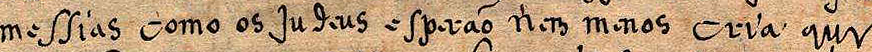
messias como os Judeus esperaõ nem menos cria que
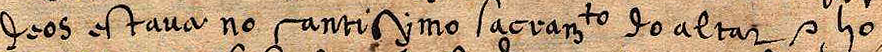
deos estaua no santisymo sacramto do altar e ho
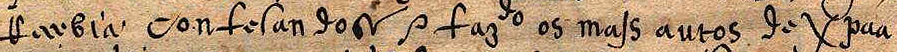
Reçebia confesandose e fazdo os maJs autos de Xpaā
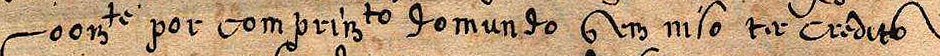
ssomte por comprimto do mundo sem niso ter credito
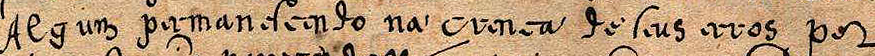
Algum permanescendo na crenca de seus erros por
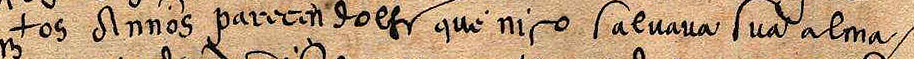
mtos Annōs parecendolhe que niso saluaua sua alma/
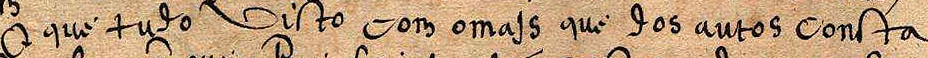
O que tudo Visto com maJs que dos autos consta
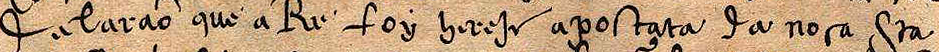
declaraõ que a Re foy hereJe apostata da nosa Sta
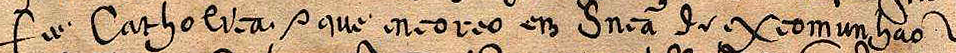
fee Catholica e que encoreo em Snçā de eXcomunhaõ
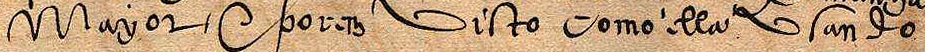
Mayor / e porem Visto como ella vsando
